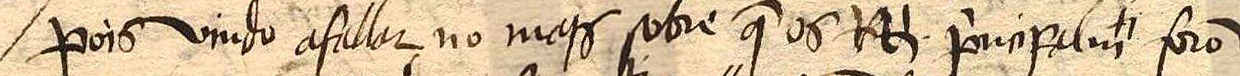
pois vindo a fallar no majs sobre q̄ os RR p̄ncipalmti forō
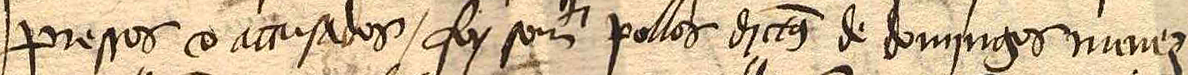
pressos e accusados / foy somti pollos djc̄tꝯ de domjngos nunez
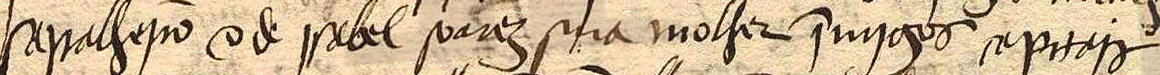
sarralhejro e de jsabel soarez sua molher j̄mjgos capitajs
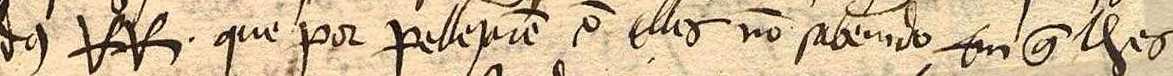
dꝯ RR. que por pellejarē c̄o Elles nō sabendo Em q̄ lhes
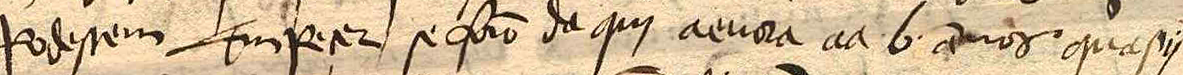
podessem Empeçer se forō daquj a euora aa .b. ānos quasy
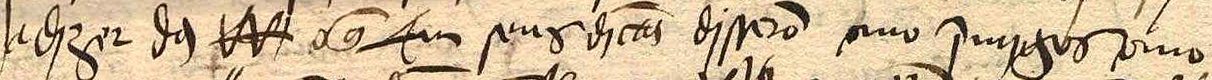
a djzer dꝯ RR o q̄ Em seus djc̄tꝯ djsserō como j̄mjgos como
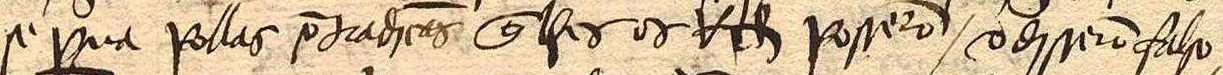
se ꝓua pollas c̄otradjc̄as q̄ lhes os RR posser̄o / e djsserō falso
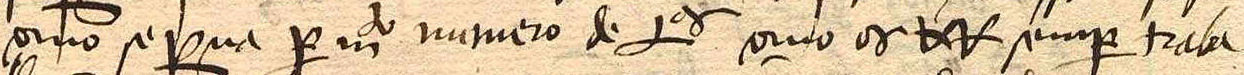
como se ꝓua ꝑ mto numero de tas como os RR semp traba
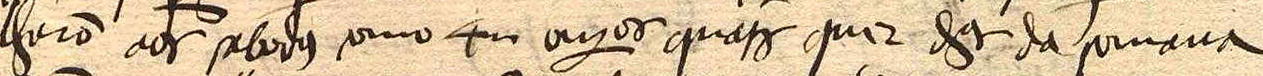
lharō aos sabodꝯ como Em outos quajsquer djas da somana
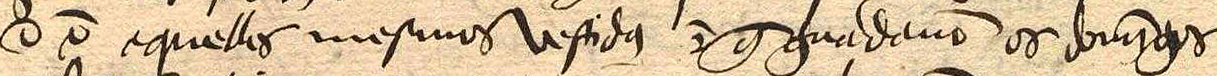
e c̄o aquelles mesmos vestidꝯ item q̄ guardauō os domj̄gos
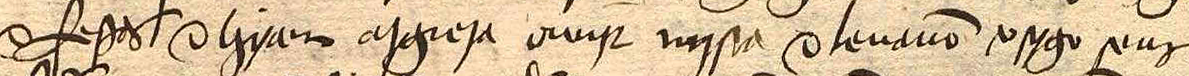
e festas e hyam a Jgreja ouujr mjssa e leuauō cosygo seus
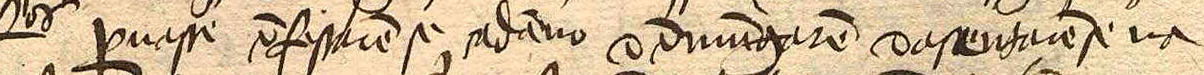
fos ꝓuasse c̄ofessarē se cadāno e c̄omūgarē e asentarē se na
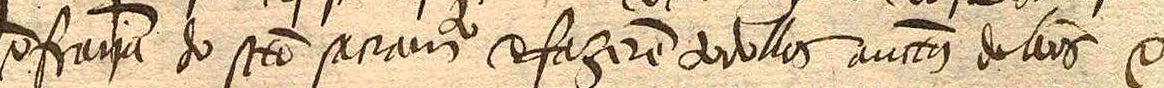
c̄ofrarja do sct̄o sacramto e fazerē todollos auc̄tꝯ de boōs e
